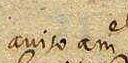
auiso a mel
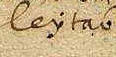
leytaõ
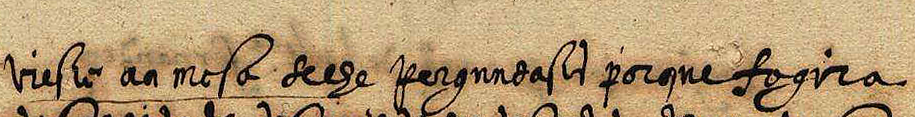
viesse aa mesa se lhe perguntassē porque fogira
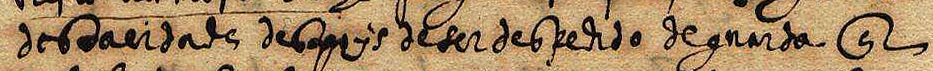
desta cidade despoys de ser despedido de guarda q̄
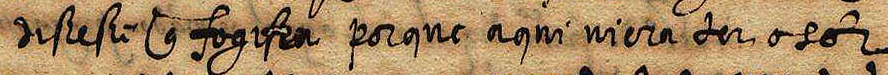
dissesse q̄ fogira porque aqui uiera ter o sōr
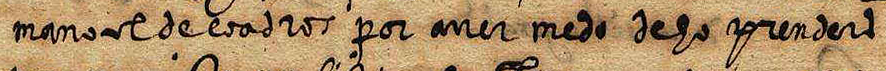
manoel de coadros por auer medo de ho prenderē
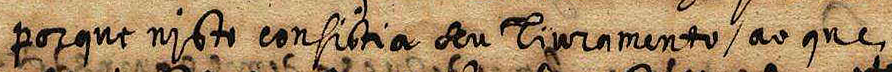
porque njsto consistia seu liuramento / ao que
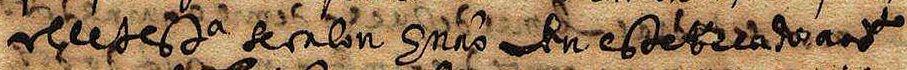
elle testa se calou E não deu este Recado ao dto
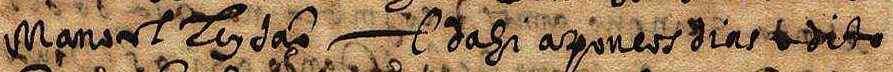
Manoel Leytaõ E dahi a poucos dias o dito
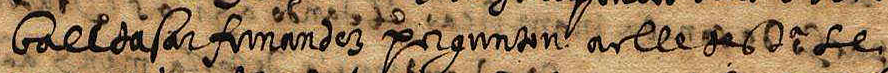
balltasar fernandez perguntou a elle testa se
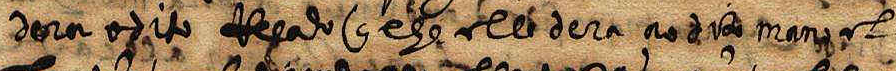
dera o dito Recado q̄ lhe elle dera ao dito manoeL
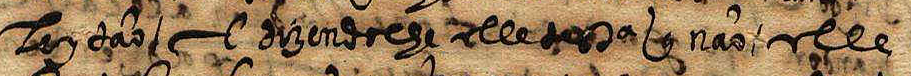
Leytão / E dizendolhe elle testa q̄ não elle
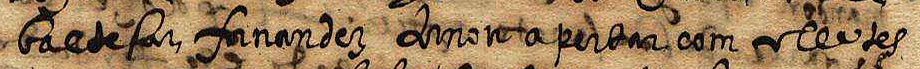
baltesar fernandez tornou apertar com elle tes
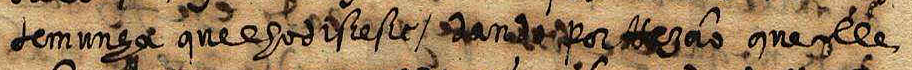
temunha que lho dissesse / dando por Rezaõ que elle
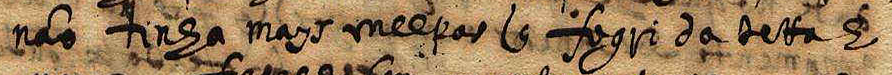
não tinha mays cullpas q̄ fogir da teRa E
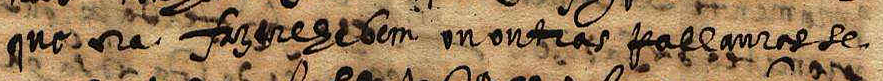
que era fazerlhe bem ou outras pallauras se
